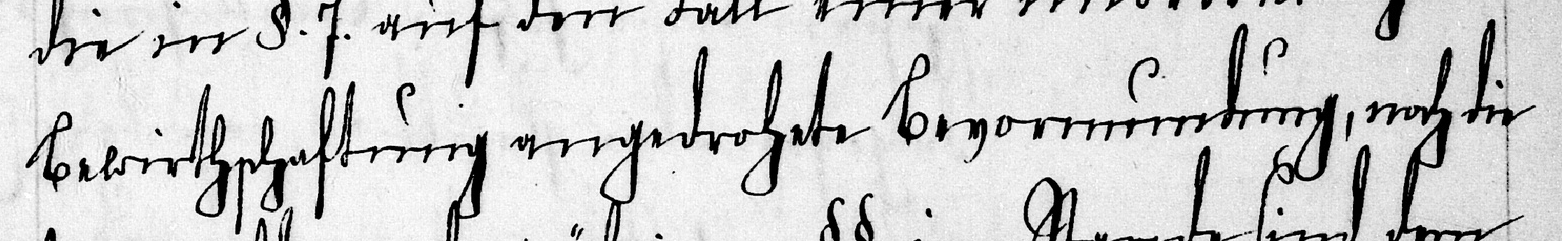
Bewirthschaftung angedrohete Bevormundung, noch die
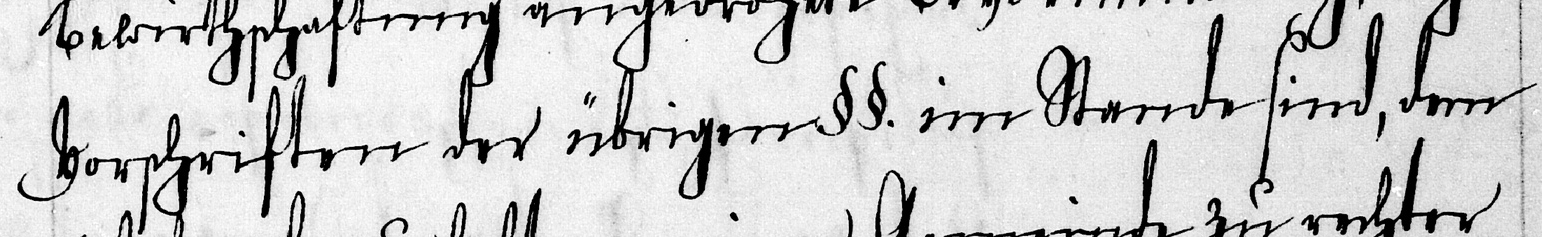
Vorschriften der übrigen §§. im Stande sind, dem
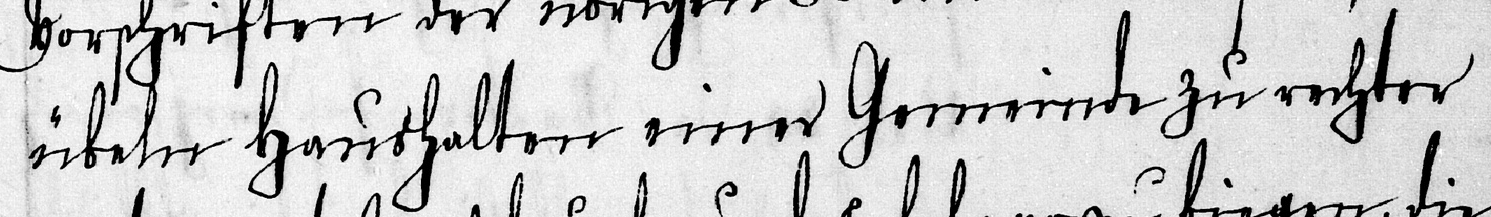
übeln Haushalten einer Gemeinde zu rechter
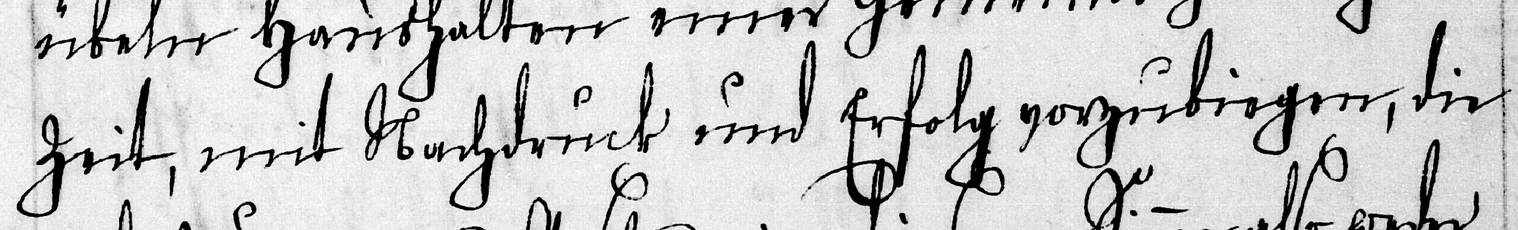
Zeit, mit Nachdruck und Erfolg vorzubiegen, die
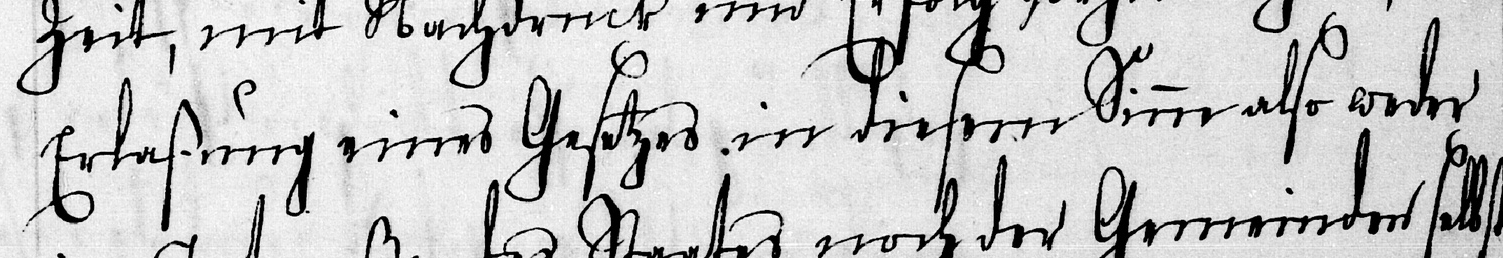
Erlaßung eines Gesetzes in diesem Sinne also weder
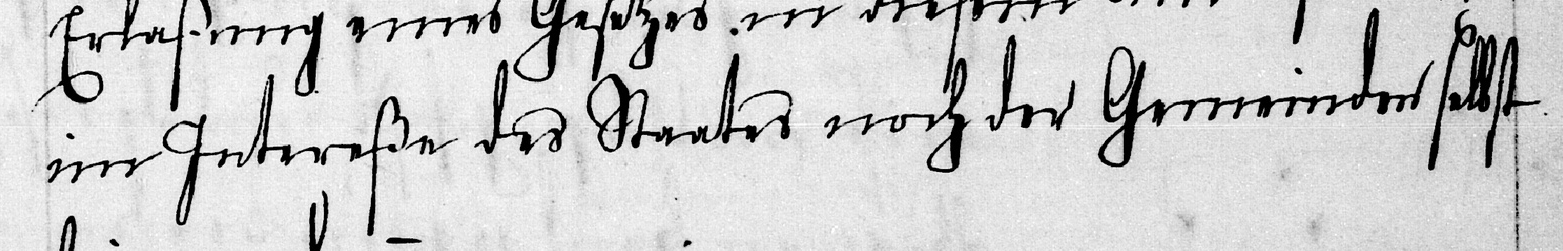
im Intereße des Staates noch der Gemeinden selbst
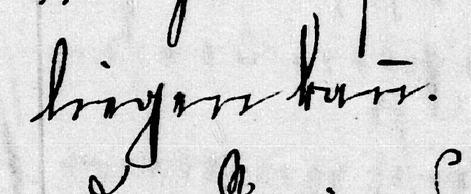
liegen kann.
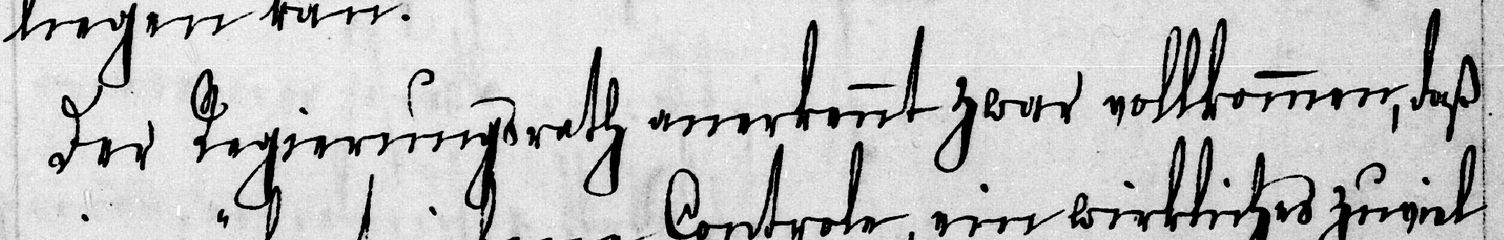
Der Regierungsrath anerkennt zwar vollkommen, daß
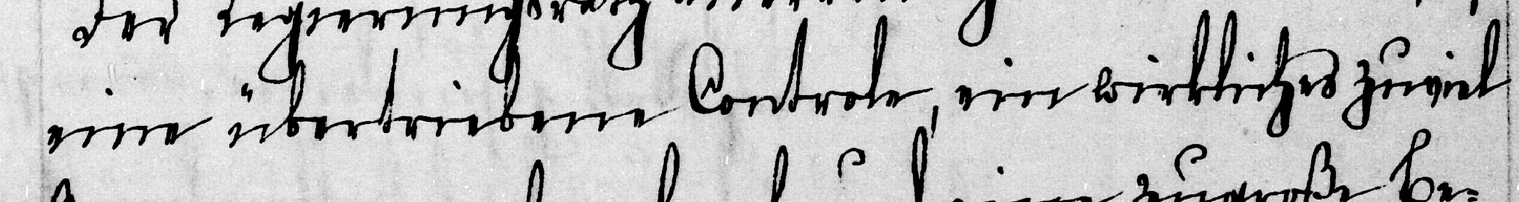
eine übertriebene Controle, ein wirkliches zuviel
